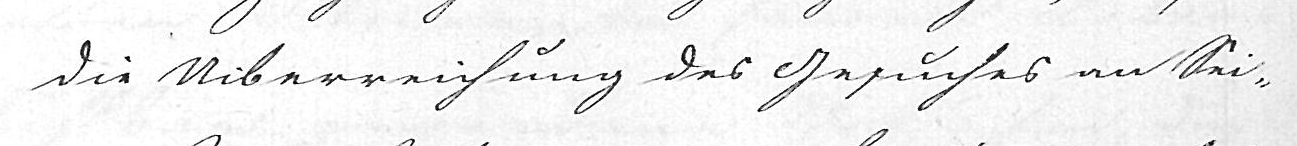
die Uiberreichung des Gesuches an Sei-
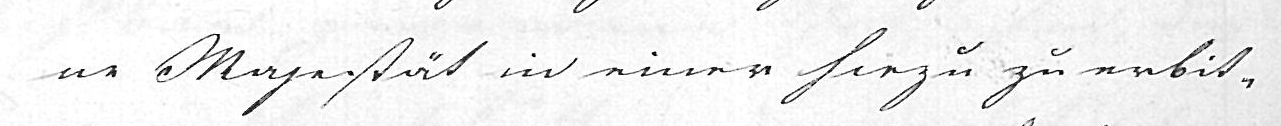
ne Majestät in einer hiezu zu erbit-
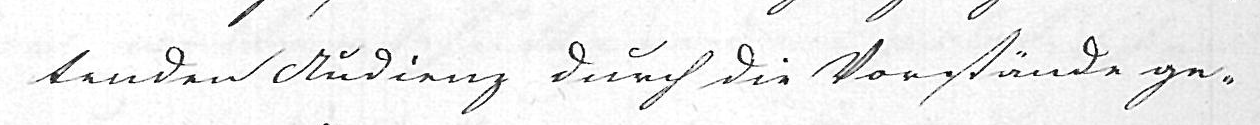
tenden Audienz durch die Vorstände ge-
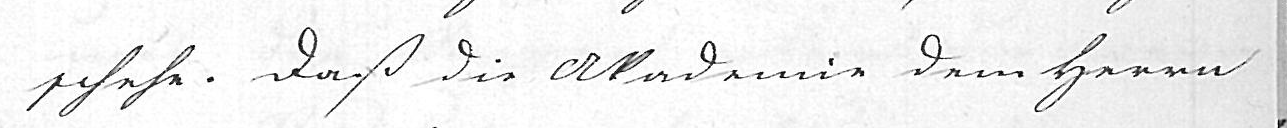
schehe. Daß die Akademie dem Herrn
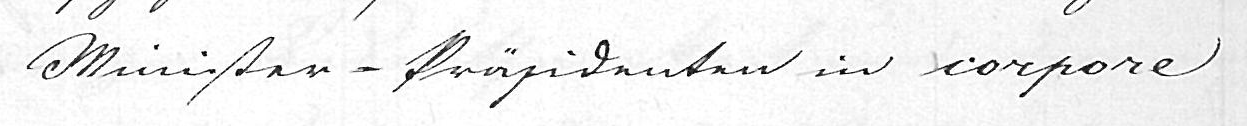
Minister-Präsidenten in corpore
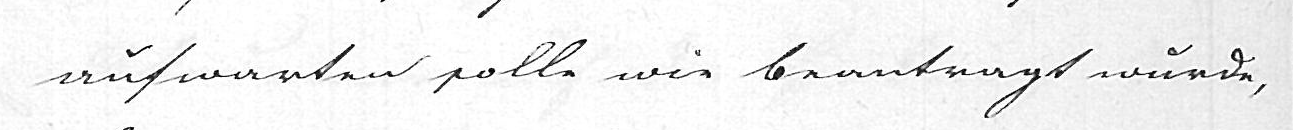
aufwarten soll wie beauftragt wurde,
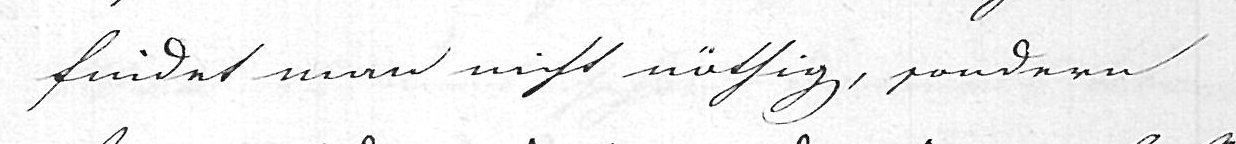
findet man nicht nöthig, sondern
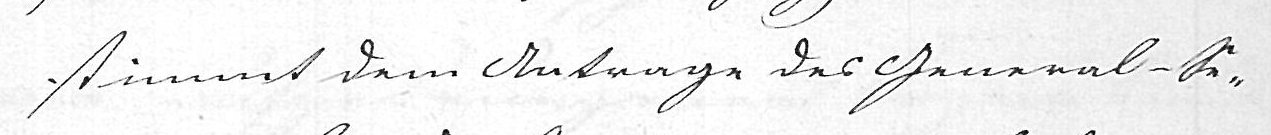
stimmt dem Antrage des General-Se-
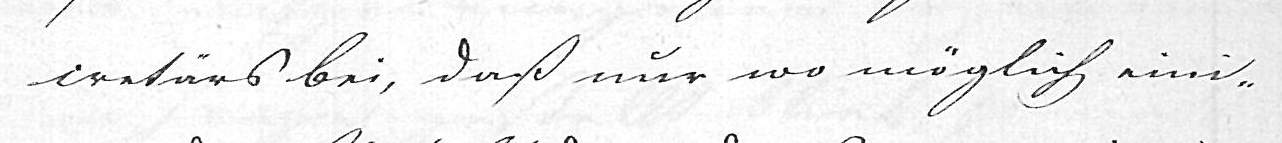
cretärs bei, daß nur wo möglich eini-
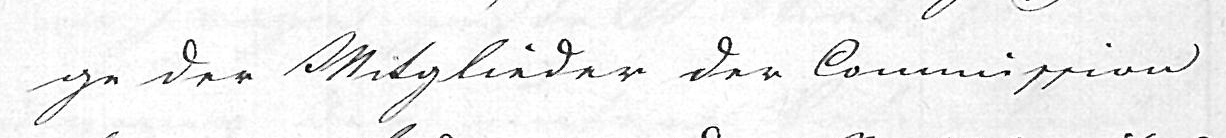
ge der Mitglieder der Commission
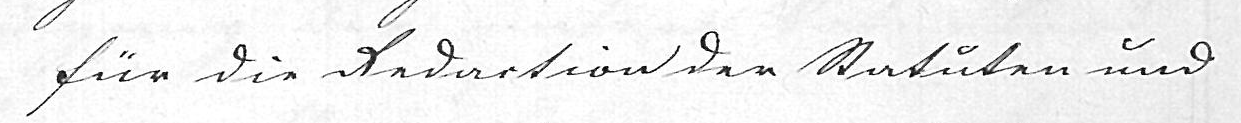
für die Redaction der Statuten und
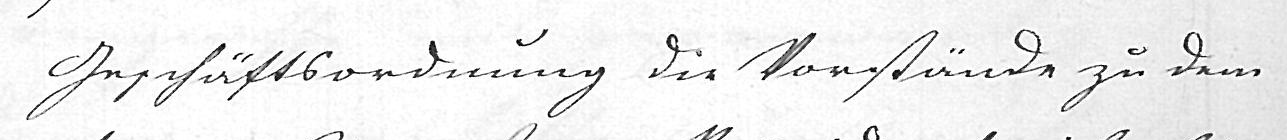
Geschäftsordnung die Vorstände zu dem
